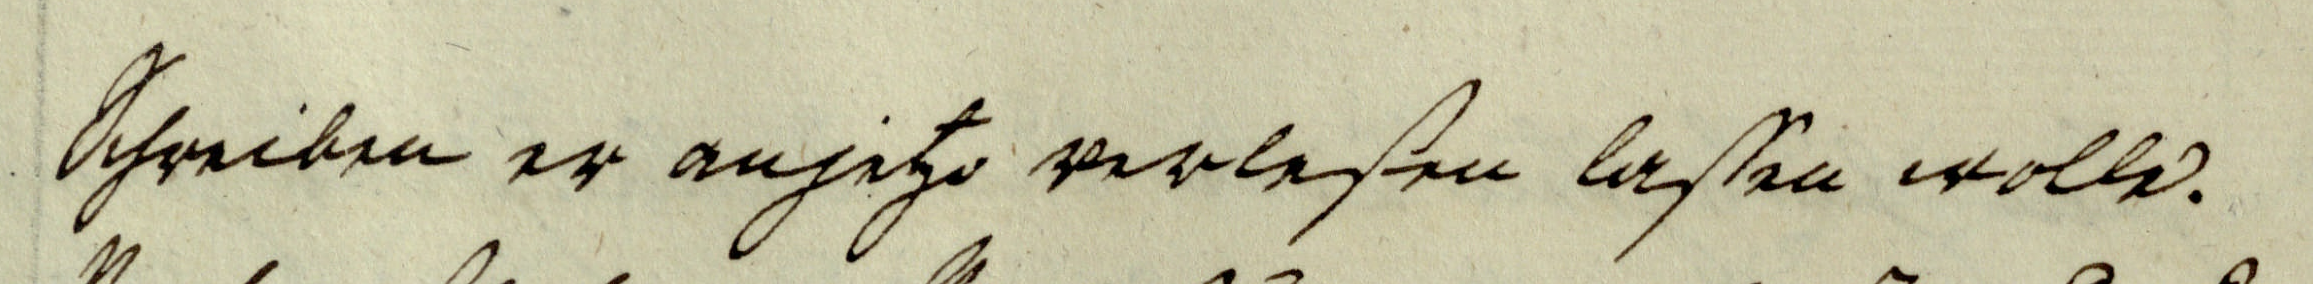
Schreiben er anjetzo verlesen lassen wolle.
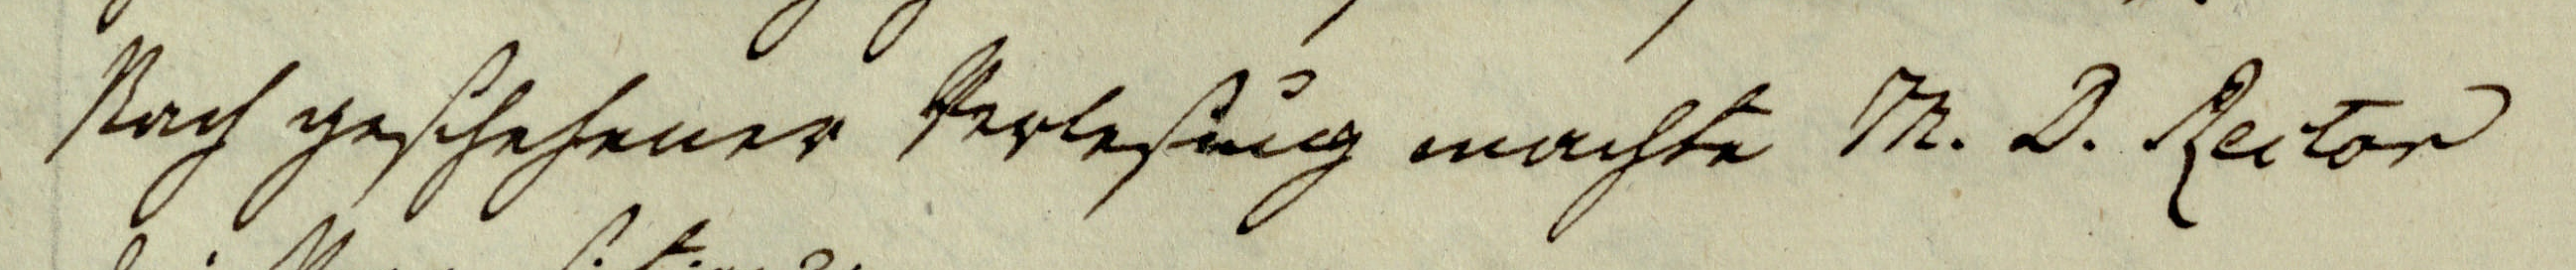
Nach geschehener Verlesung machte M. D. Rector
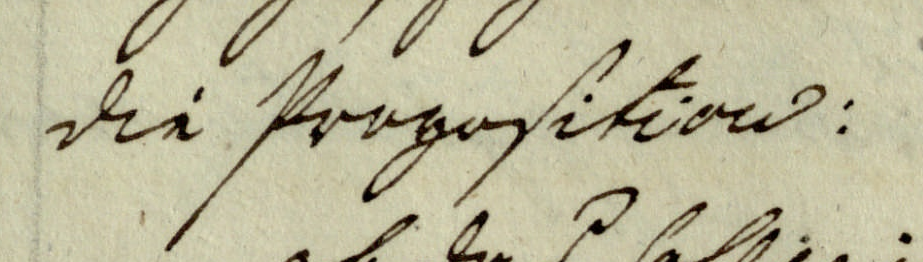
die Proposition:
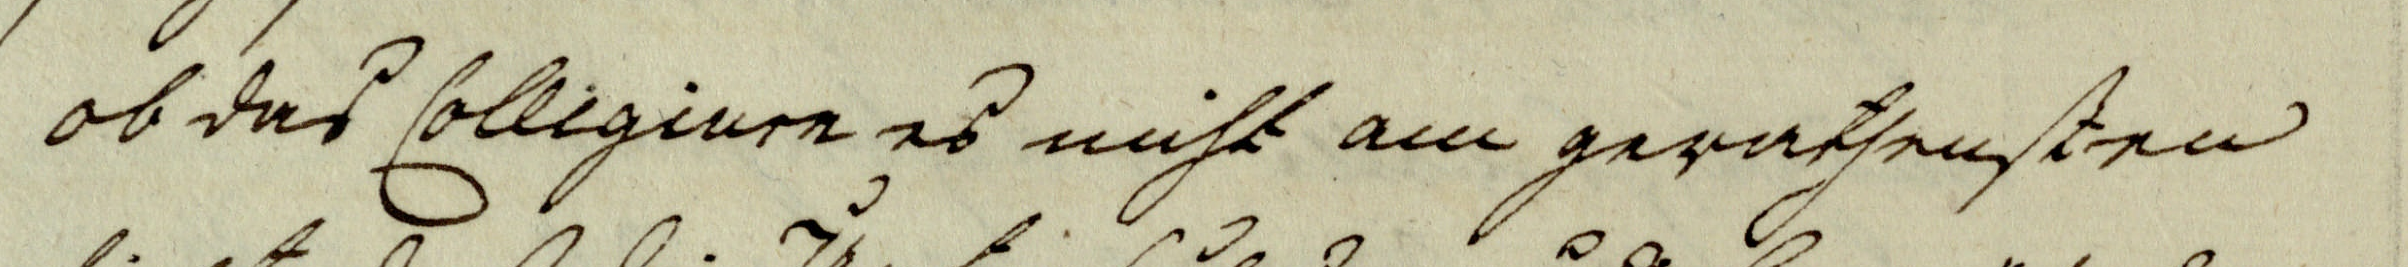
ob das Collegium es nicht am gerathensten
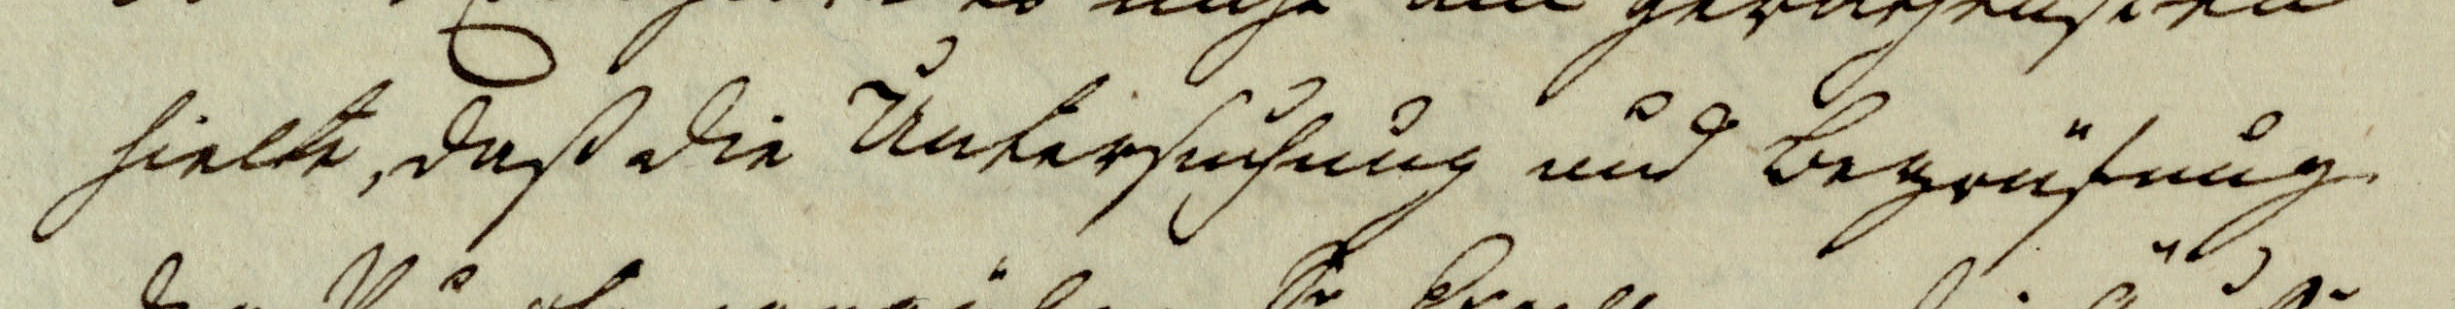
hielte, daß die Untersuchung und Beprüfung
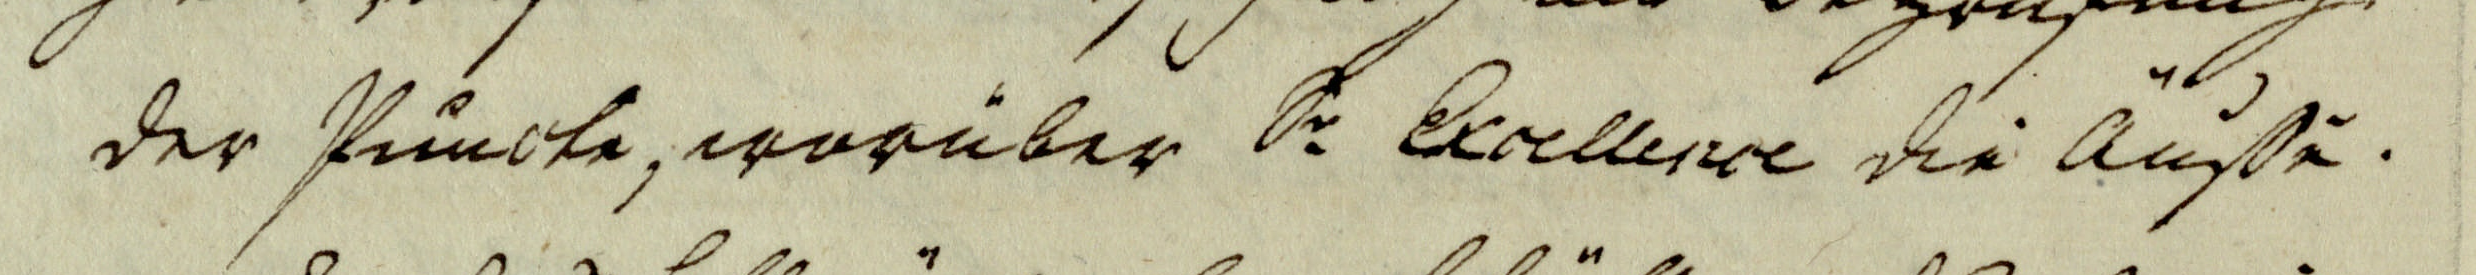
der Puncte, worüber Sr Excellence die Äusse¬
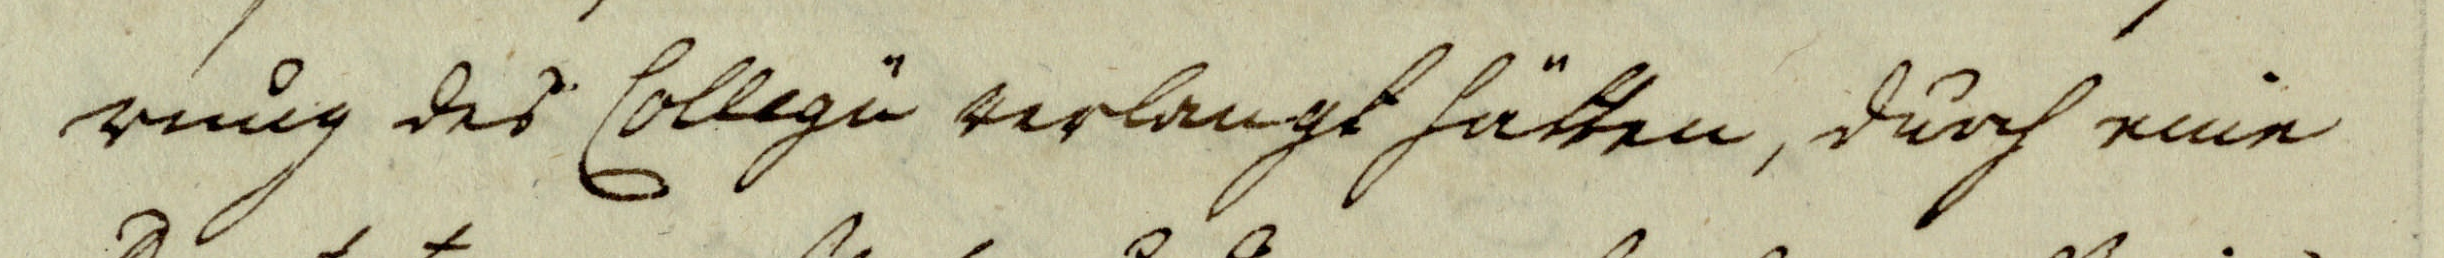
rung des Collegii verlangt hätten, durch eine
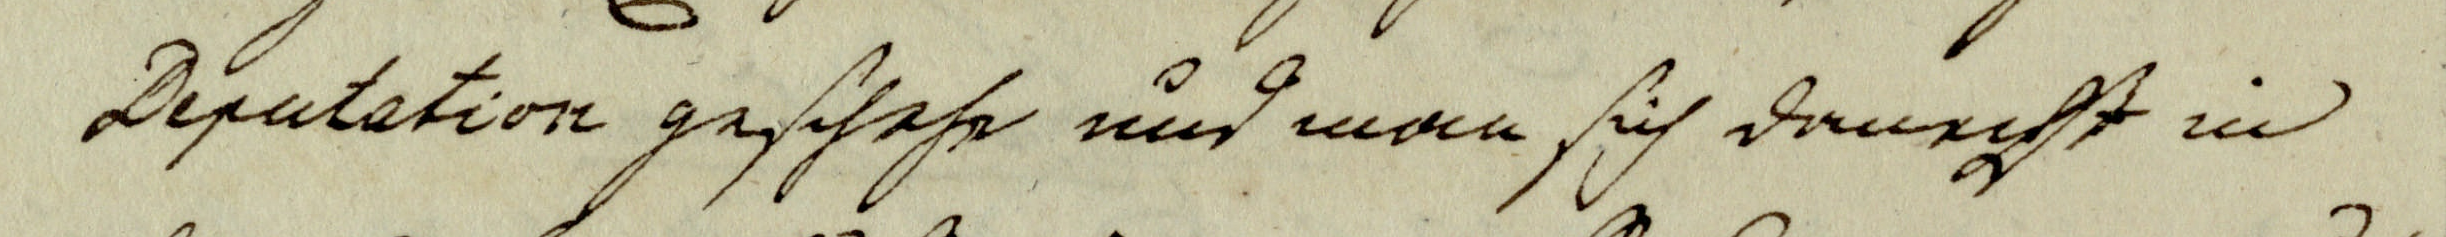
Deputation geschehe und man sich danechst in
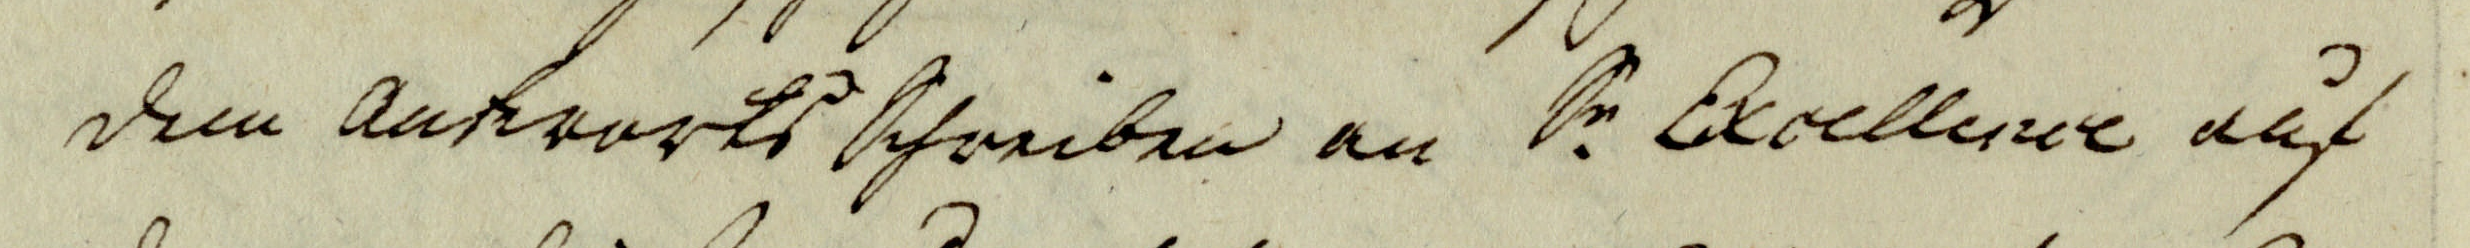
dem Antworts Schreiben an Sr. Excellence auf
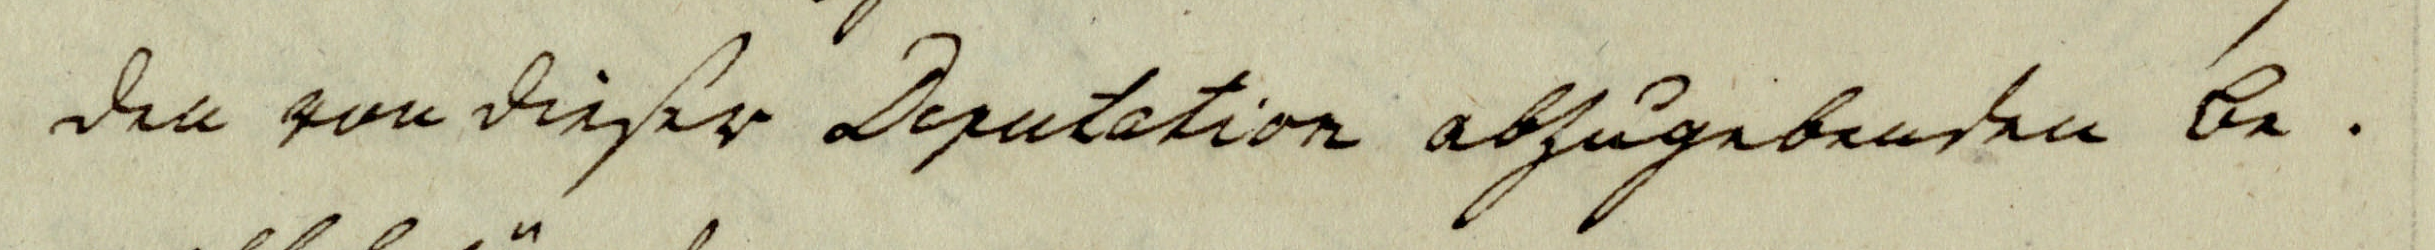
den von dieser Deputation abzugebenden Be¬
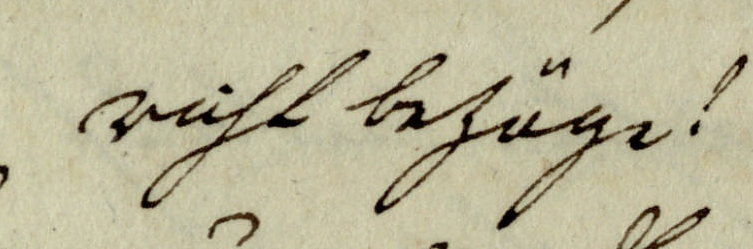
richt bezöge.
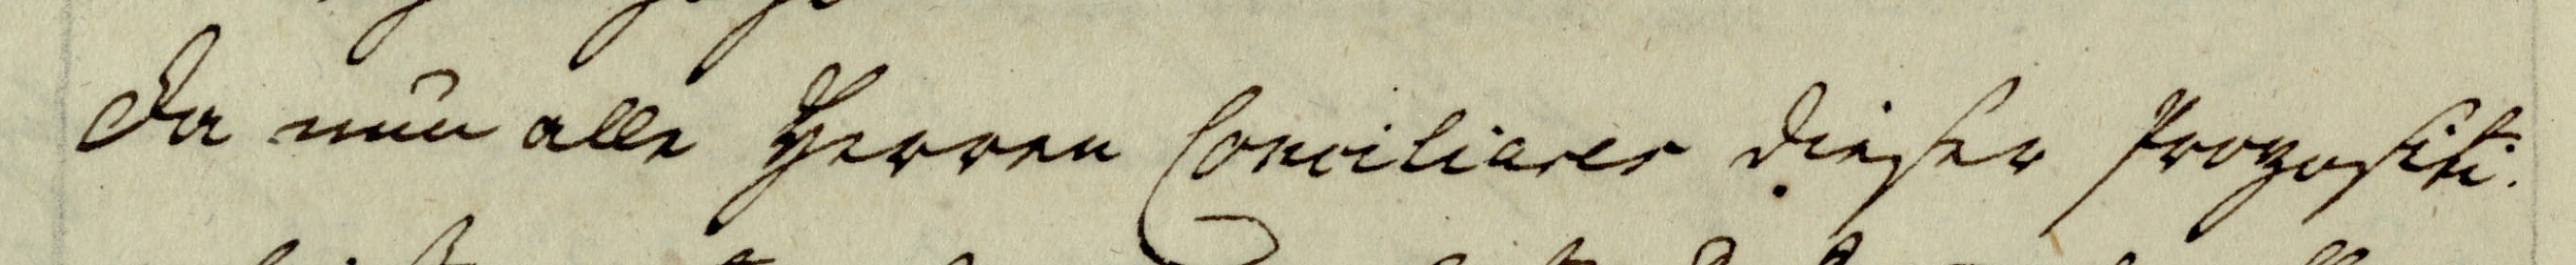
Da nun alle Herren Conciliares dieser Propositi¬
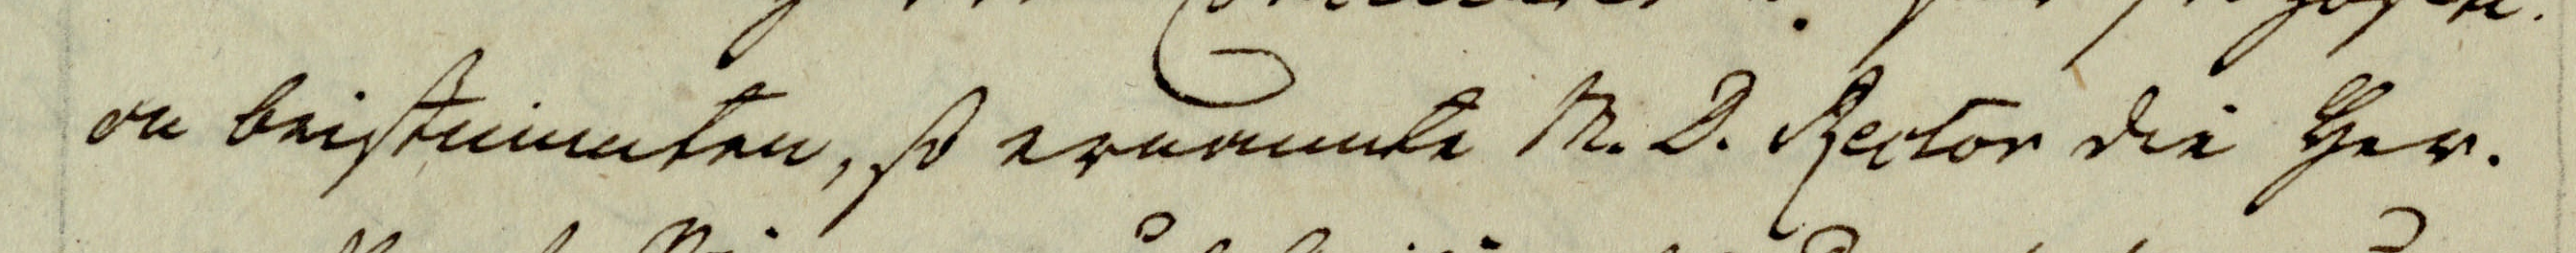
on beistimmten, so ernannte M. D. Rector die Her¬
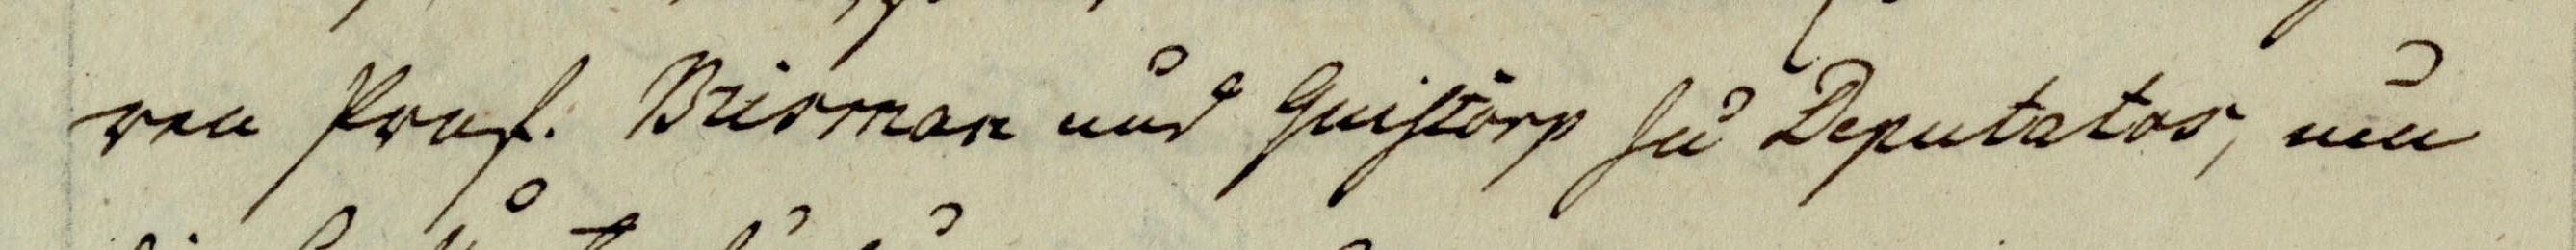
ren Prof. Brisman und Quistorp zu Deputatos, um
